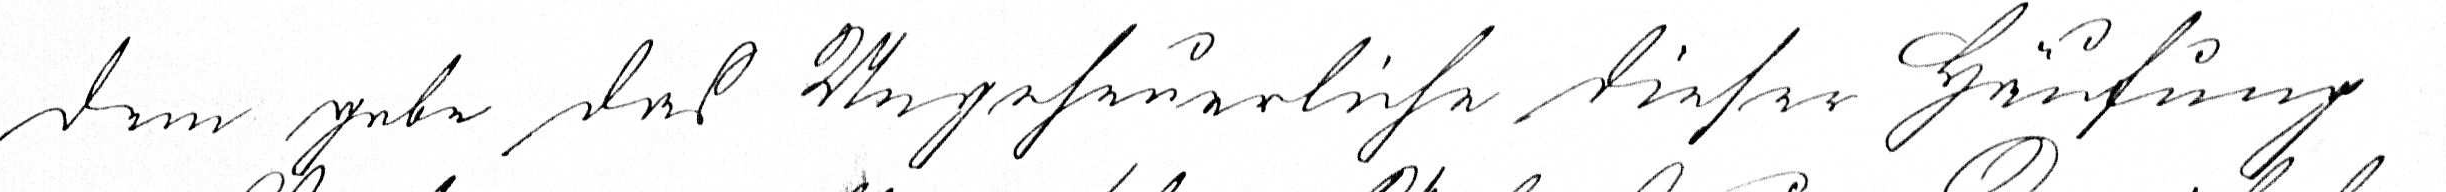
dem gabe das Ungeheuerliche dieser Häufung
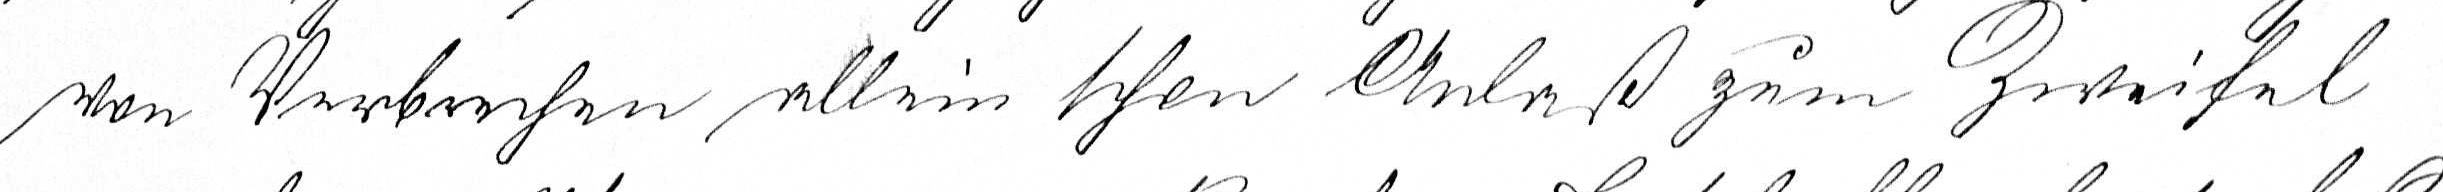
von Verbrechen allein schon Anlaß zum Zweifel
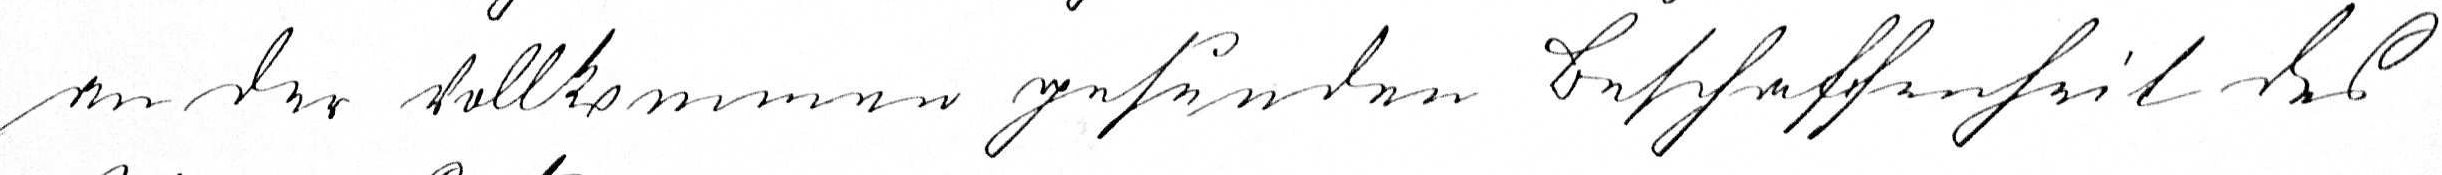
an der vollkommen gefunden Beschaffenheit des
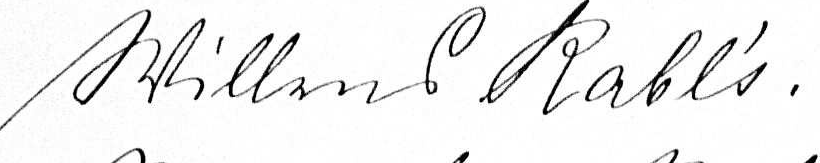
Willens Rabl's.
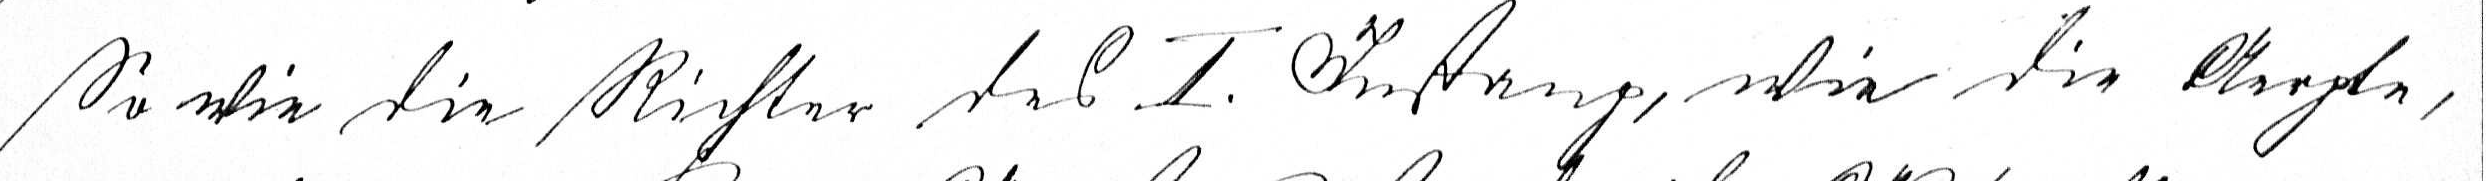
So wie die Richter des I. Instanz, wie die Aerzte,
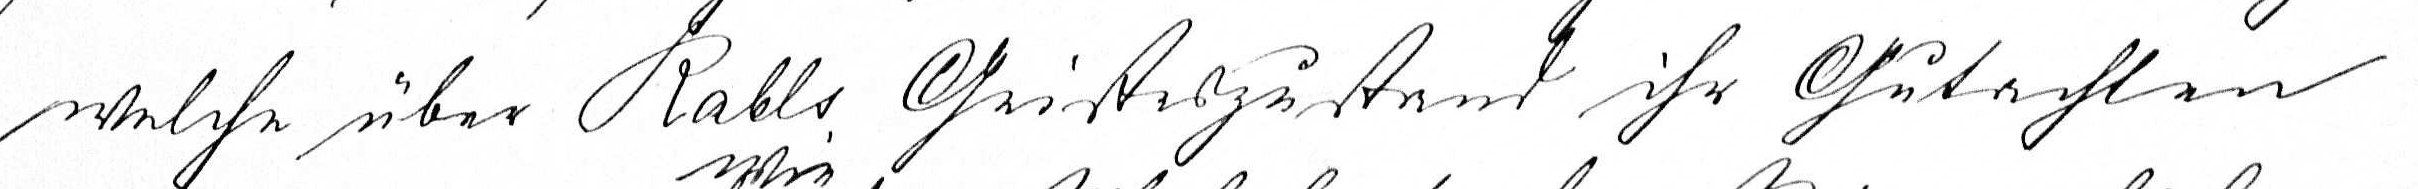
welche über Rabls Geisteszustand ihr Gutachten
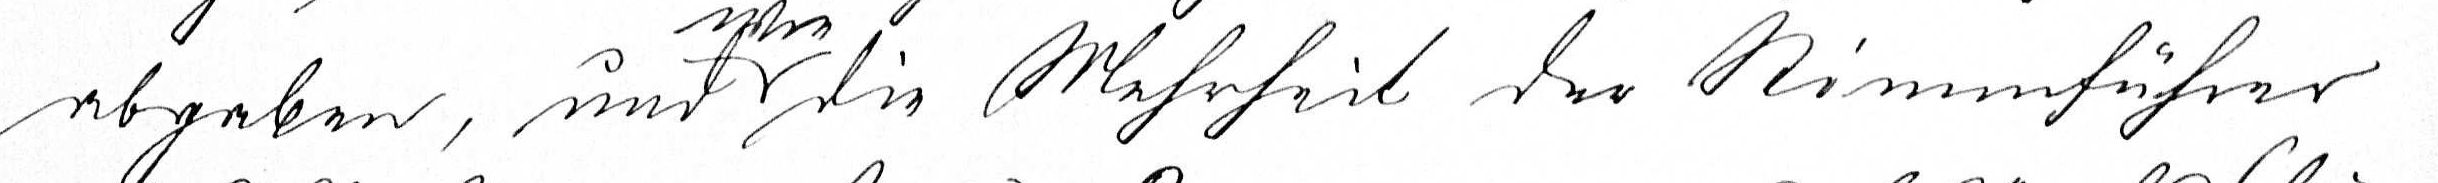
abgeben, und wie die Mehrheit der Stimmführer
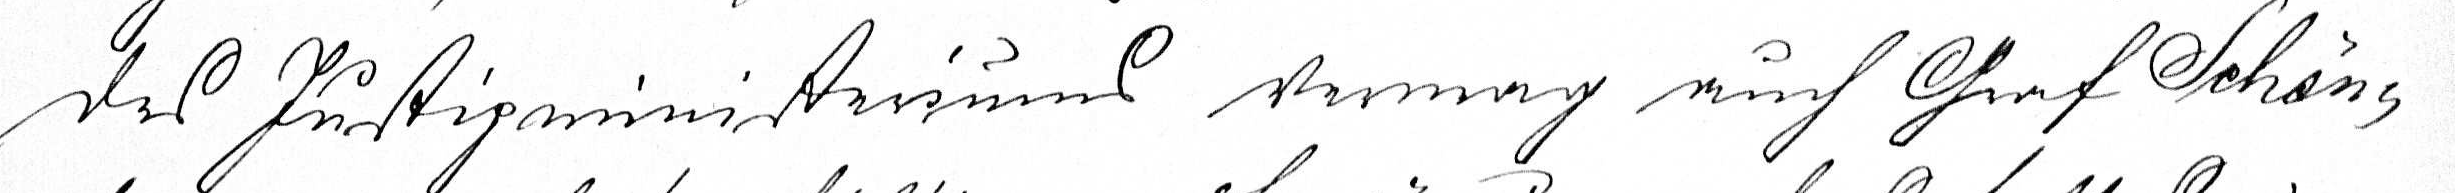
des Justizministeriums vermag auch Graf Schön¬
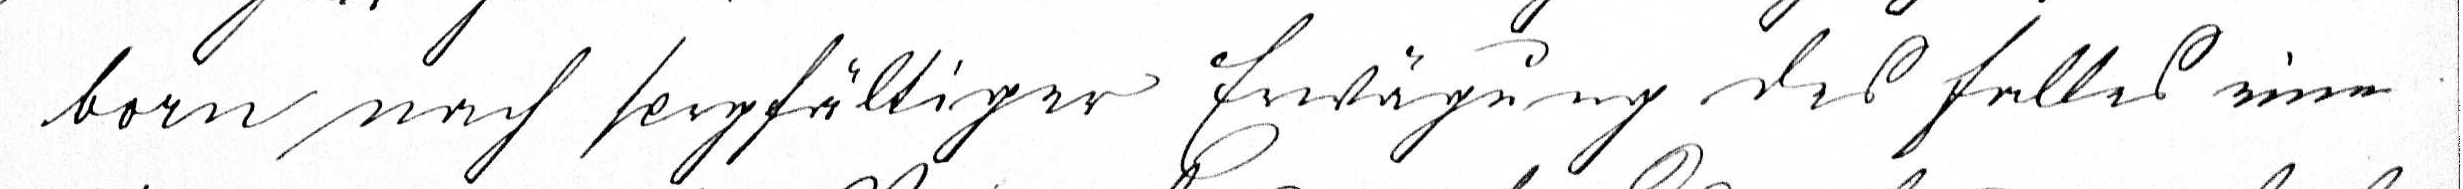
born nach sorgfältiger Erwägung des Falles eine
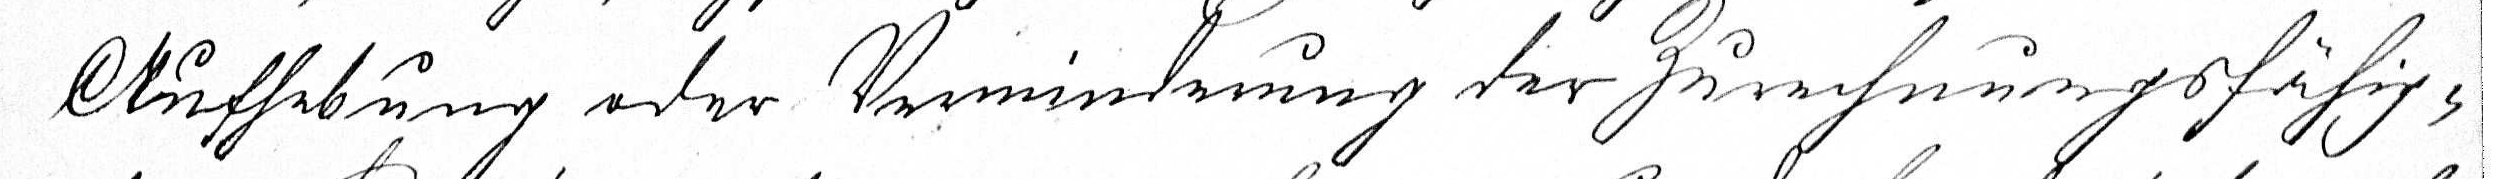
Aufhebung oder Verminderung der Zurechnungsfähig¬
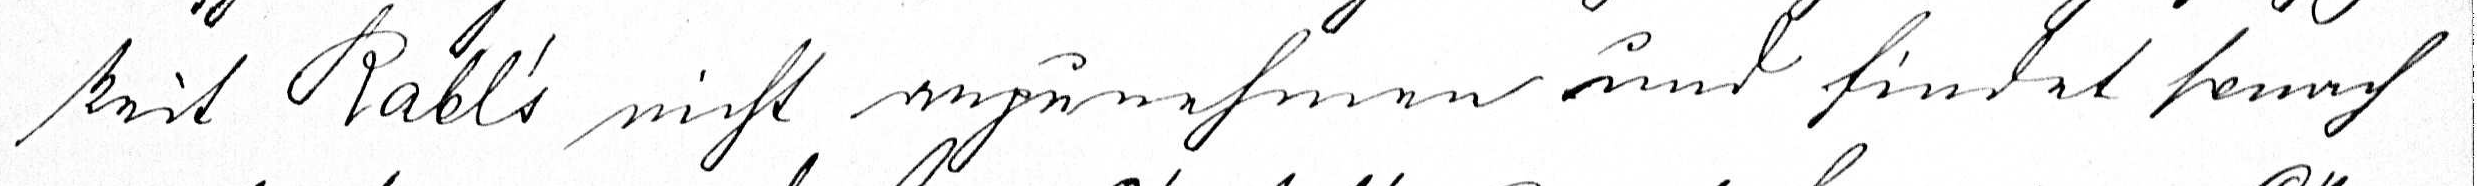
keit Rabl's nicht anzunehmen und findet sonach
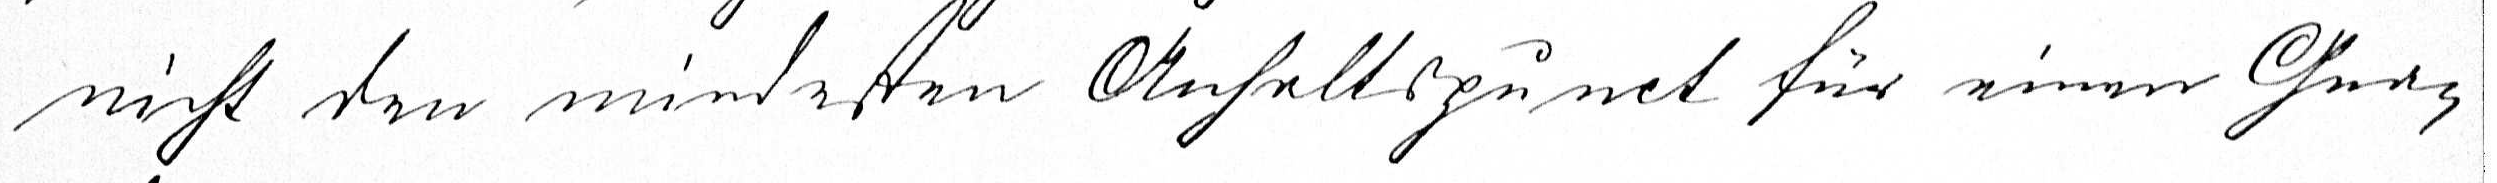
nicht den mindesten Anhaltspunct für einen Gna¬
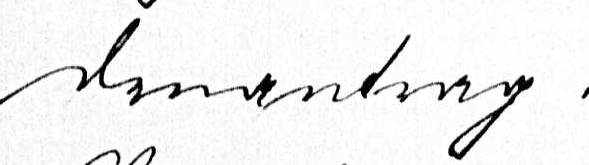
denantrag.
